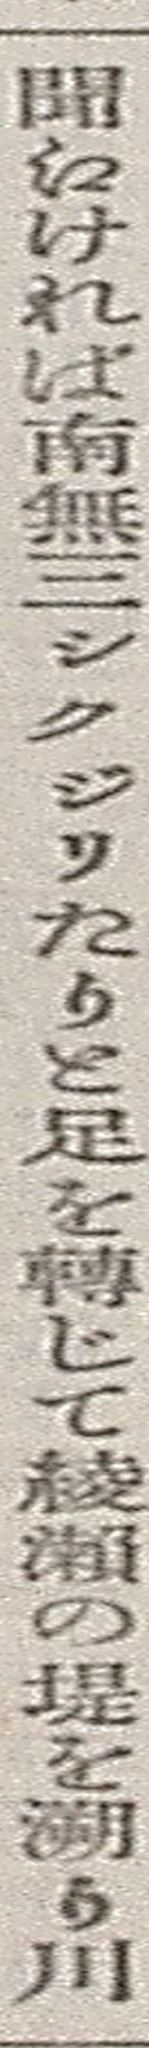聞えければ南無三シクジリたりと足を転じて綾瀬の堤を溯り川
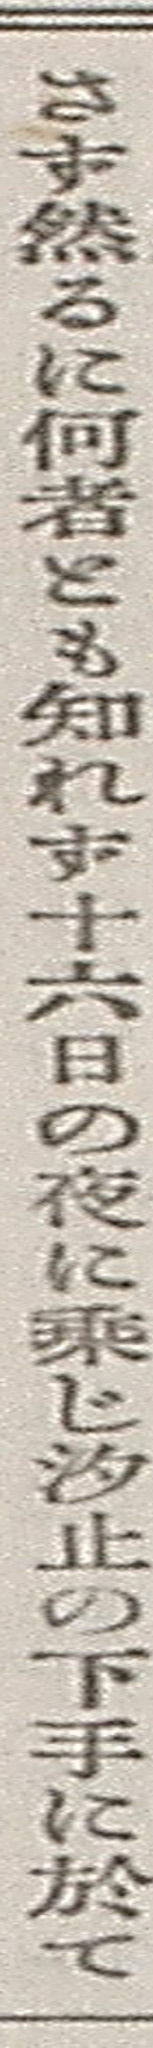さず然るに何者とも知れず十六日の夜に乗じ汐止の下手に於て
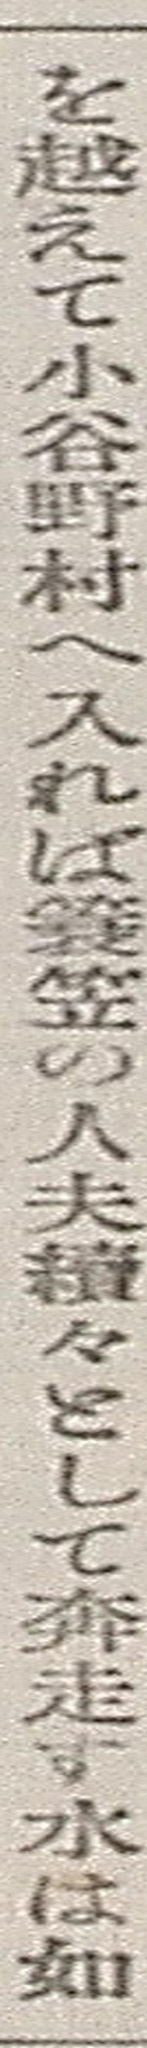を越えて小谷野村へ入れば蓑笠の人夫続々として奔走す水は如
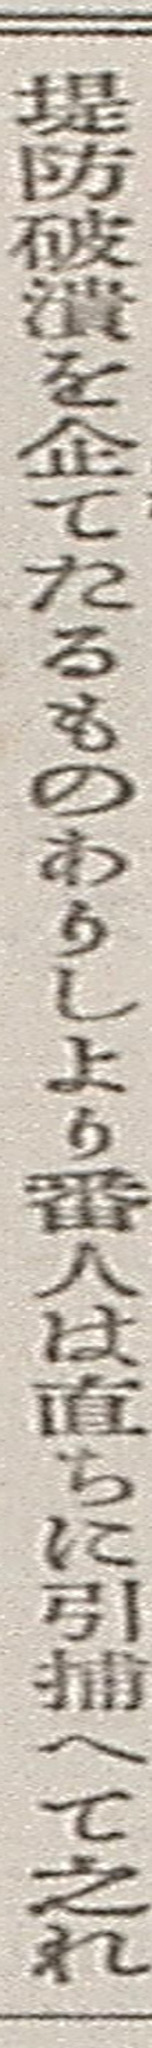堤防破潰を企てたるものありしより番人は直ちに引捕へて之れ
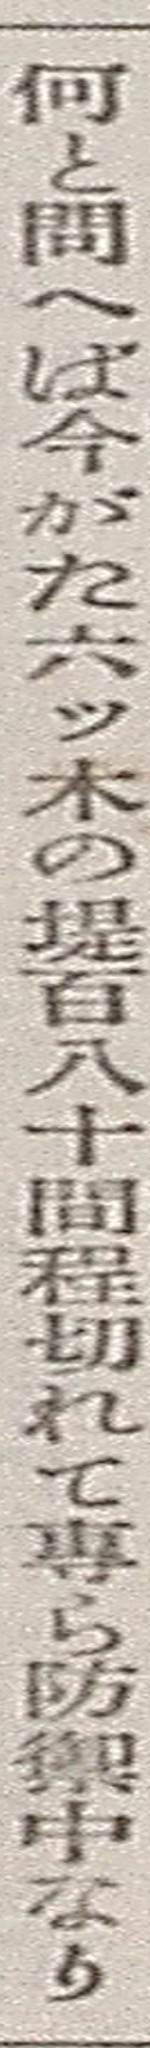何と問へば今がた六ツ木の堤百八十間程切れて専ら防禦中なり
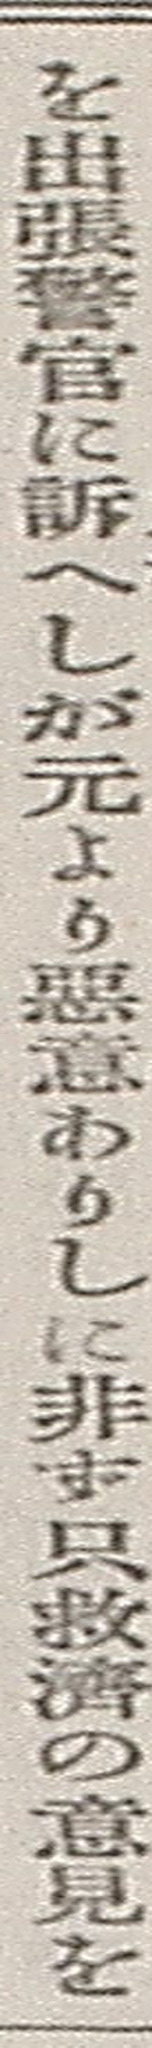を出張警官に訴へしが元より悪意ありしに非ず只救済の意見を
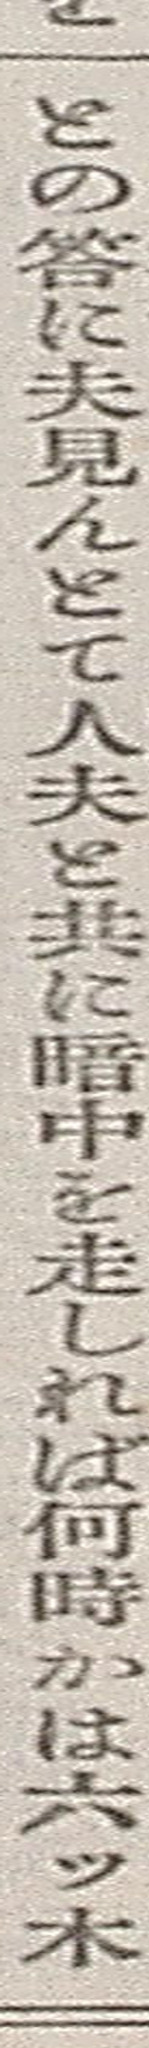との答に夫見んとて人夫と共に暗中を走しれば何時かは六ツ木
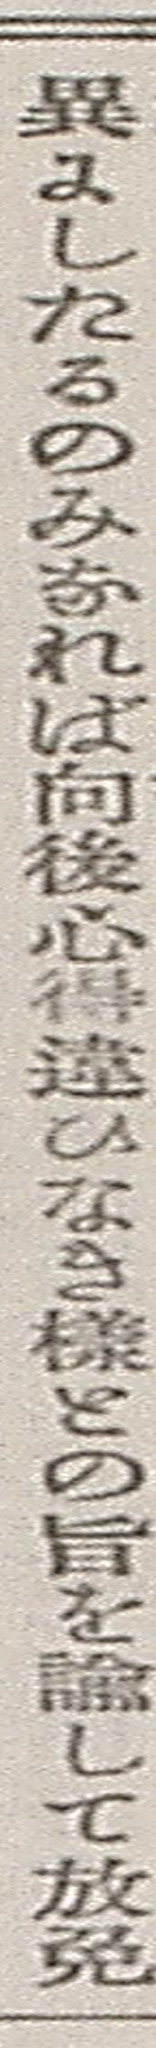異にしたるのみなれば向後心得違ひなき様との旨を諭して放免
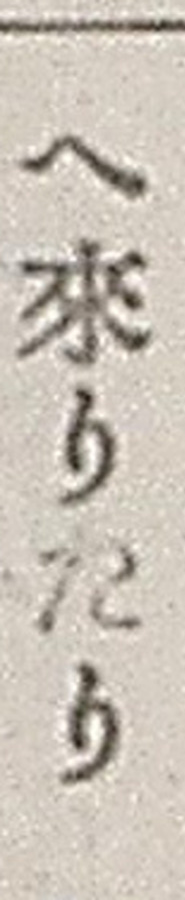へ来りたり
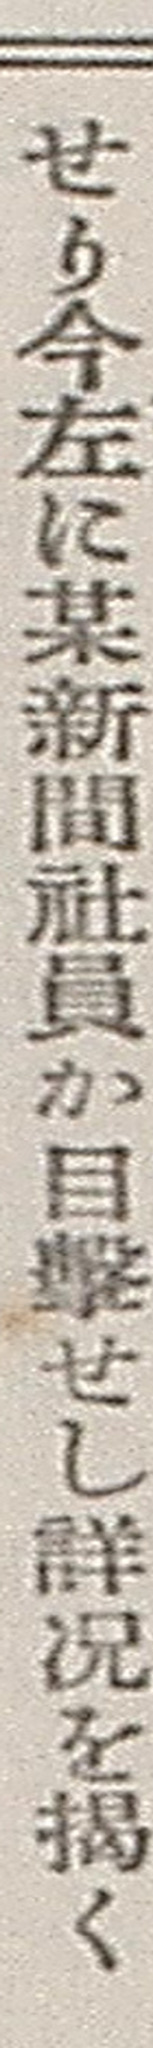せり今左に某新聞社員か目撃せし詳況を掲く
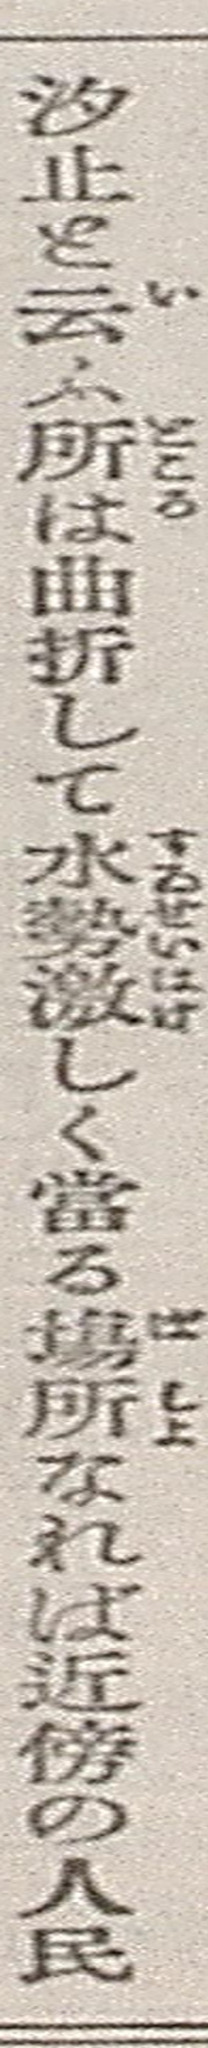汐止と云ふ所は曲折して水勢激しく当る場所なれば近傍の人民
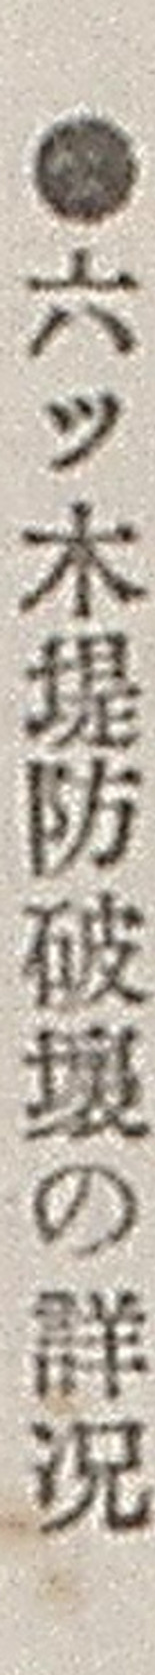●六ツ木堤防破壊の詳況
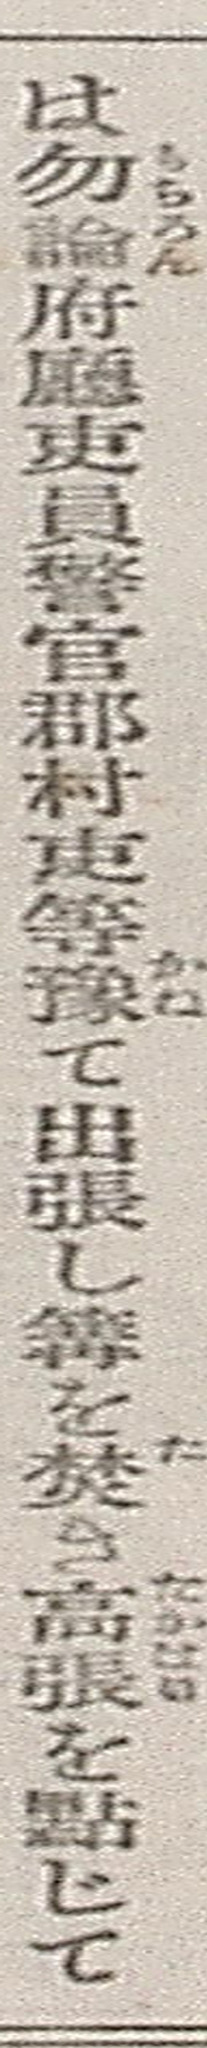は勿論府庁吏員警官郡村吏等予て出張し篝を焚き高張を点じて
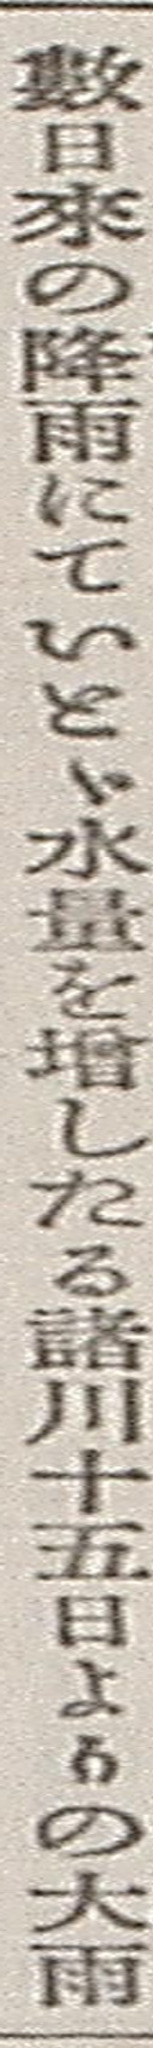数日来の降雨にていとゞ水量を増したる諸川十五日よりの大雨
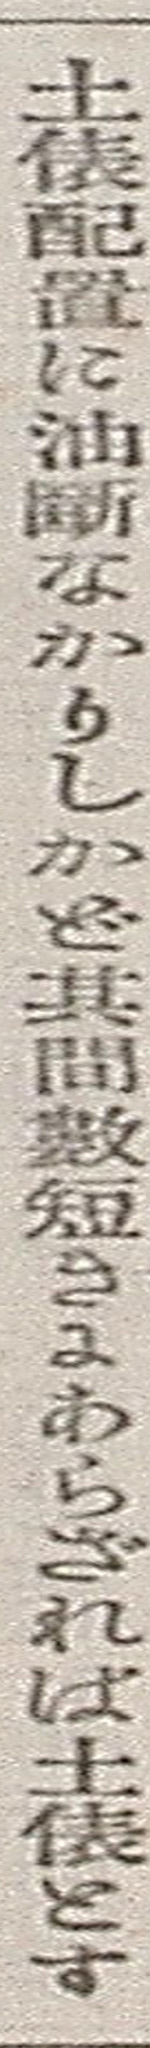土俵配置に油断なかりしかど其間数短きにあらざれば土俵とす
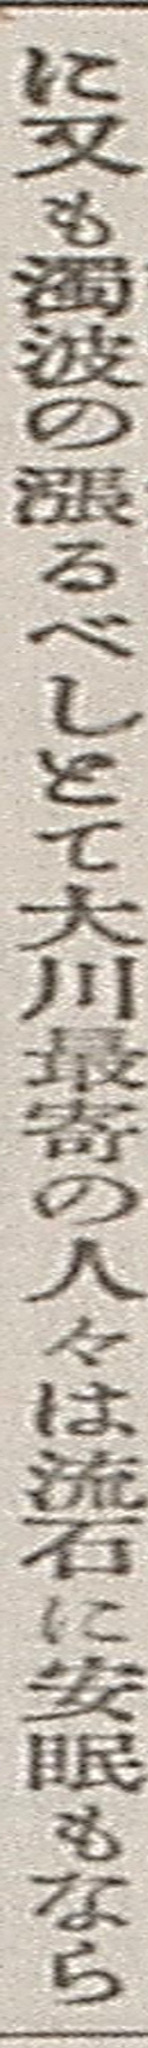に又も濁波の漲るべしとて大川最寄の人々は流石に安眠もなら
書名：風俗畫報臨時増刊第百二十四號　洪水地震被害録（上）
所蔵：東京大学地震研究所図書室 Earthquake Research Institute Library, The University of Tokyo, JAPAN
